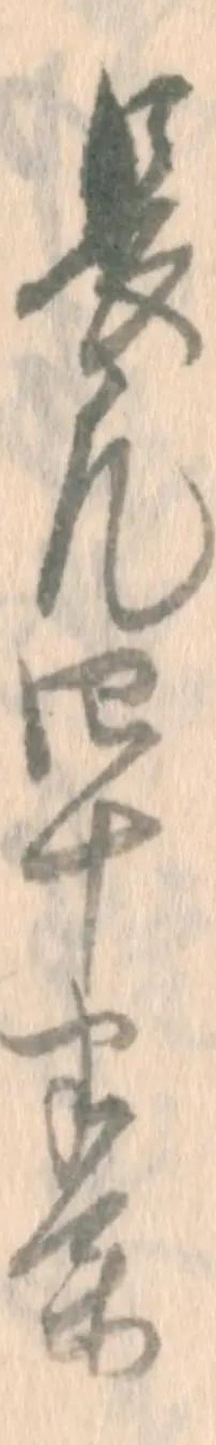長凡四十半余
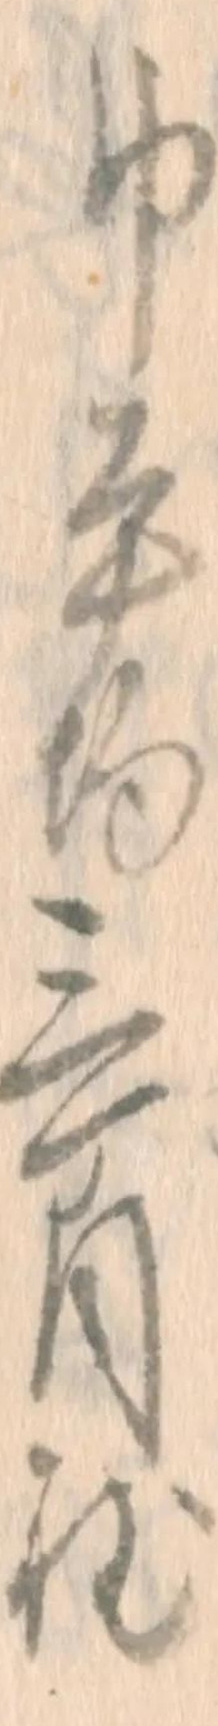幅平均三丁程
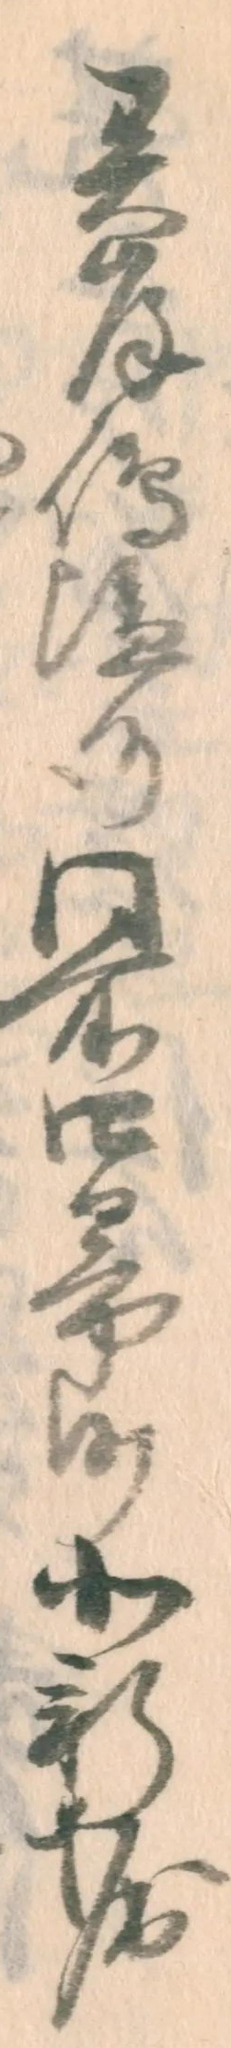一霊岸島塩町同所四日市町北新堀
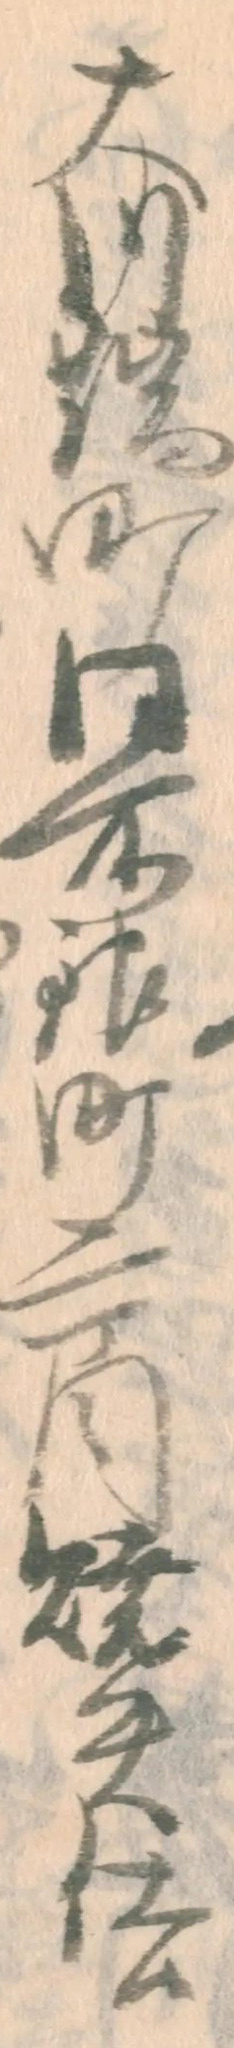大川端町同所銀町二丁目焼失仕候
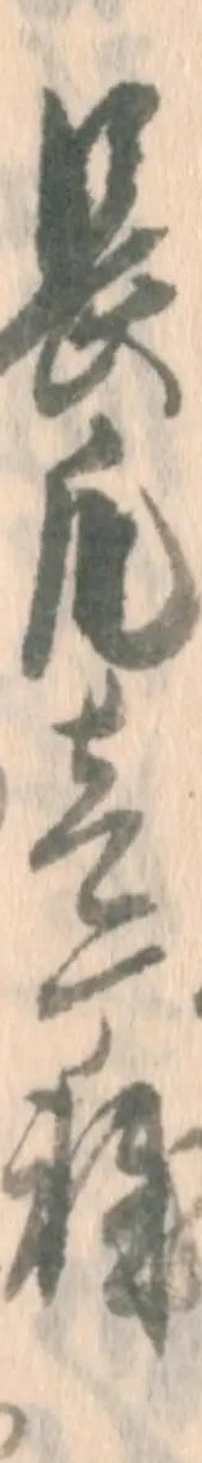長凡壱丁程
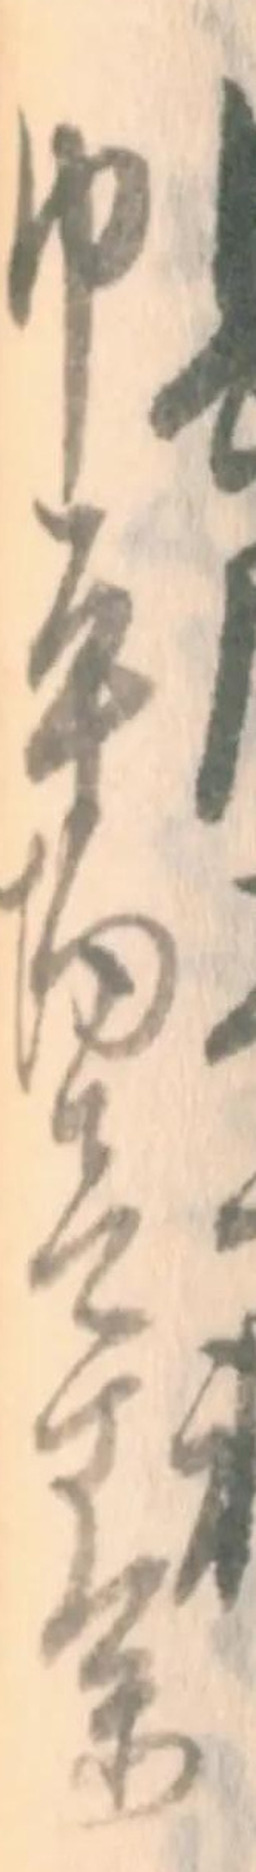幅平均壱丁余
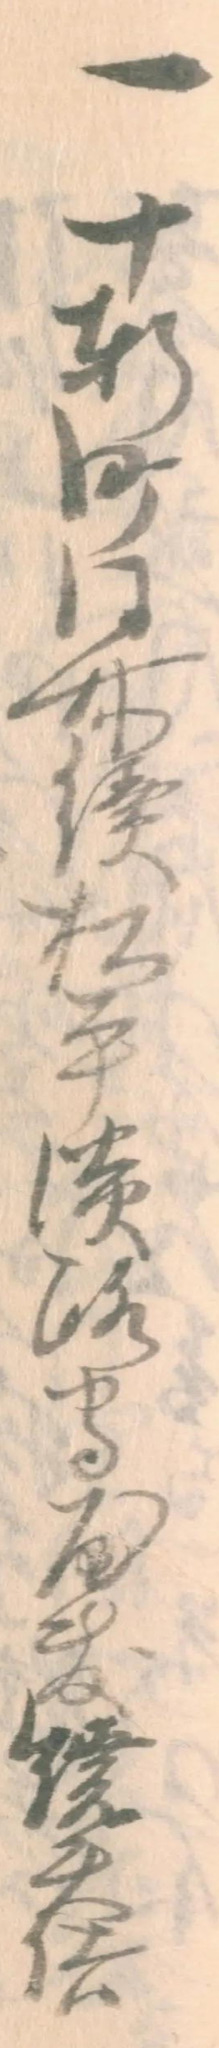一十軒町同所続松平淡路守屋敷焼失仕候
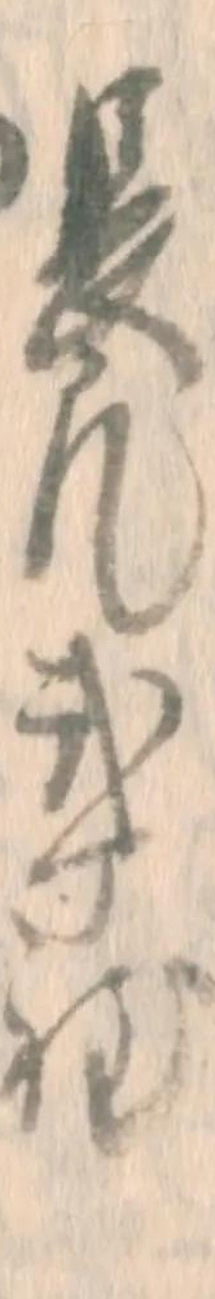長凡弐丁程
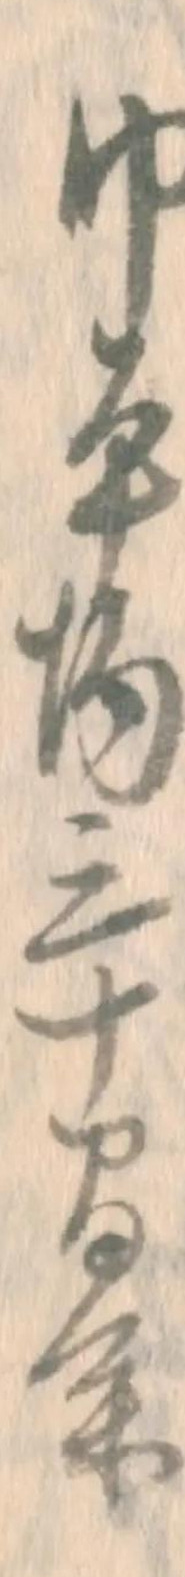幅平均三十間余
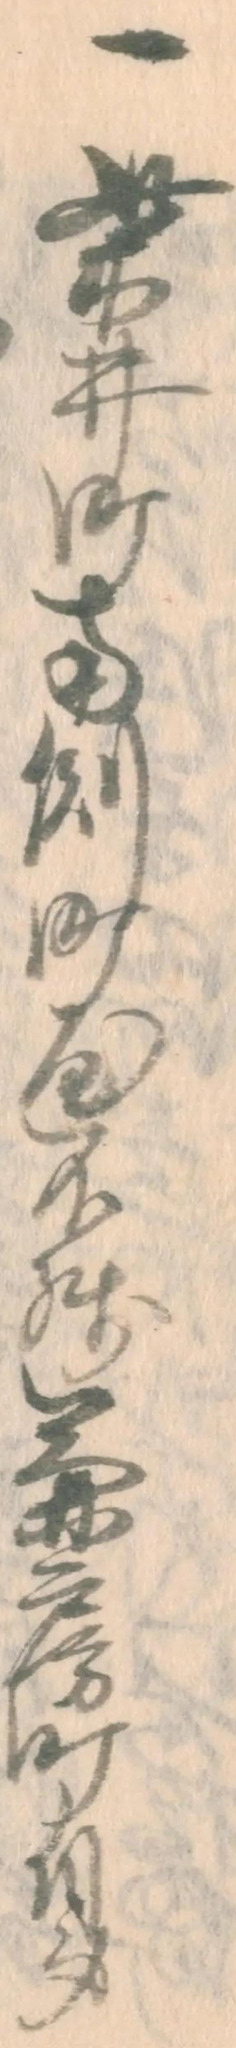一荒井町南側町屋不残兼房町自身
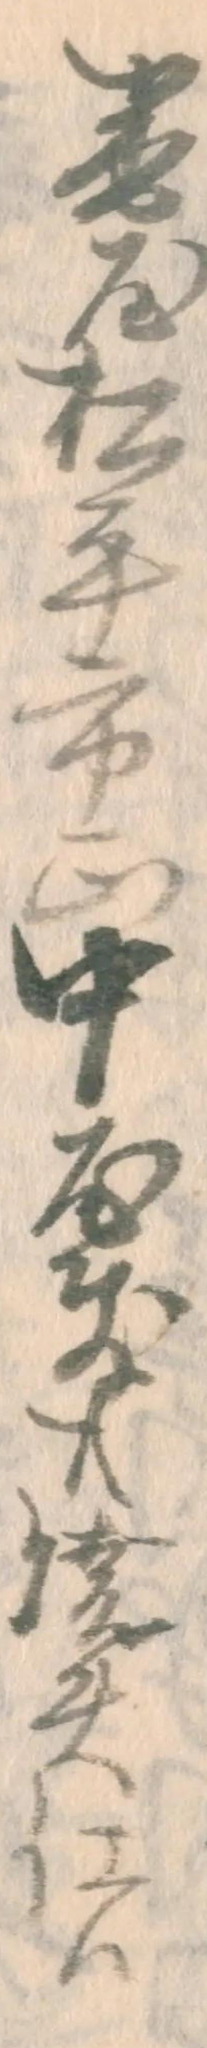番屋松平市正中屋敷共焼失仕候
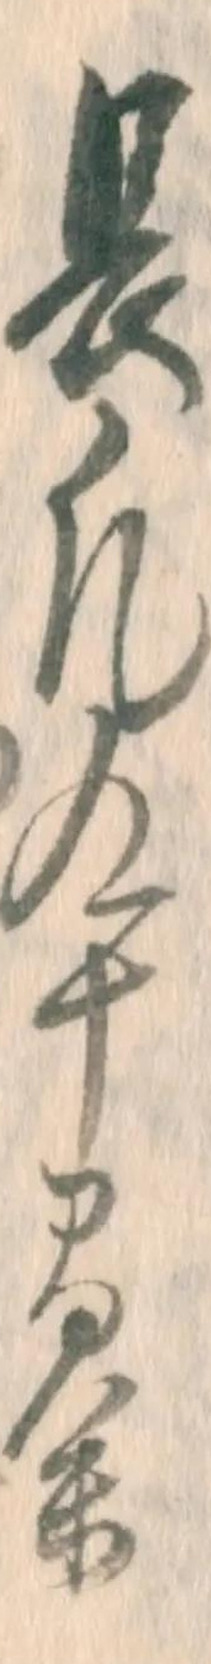長凡九十間余
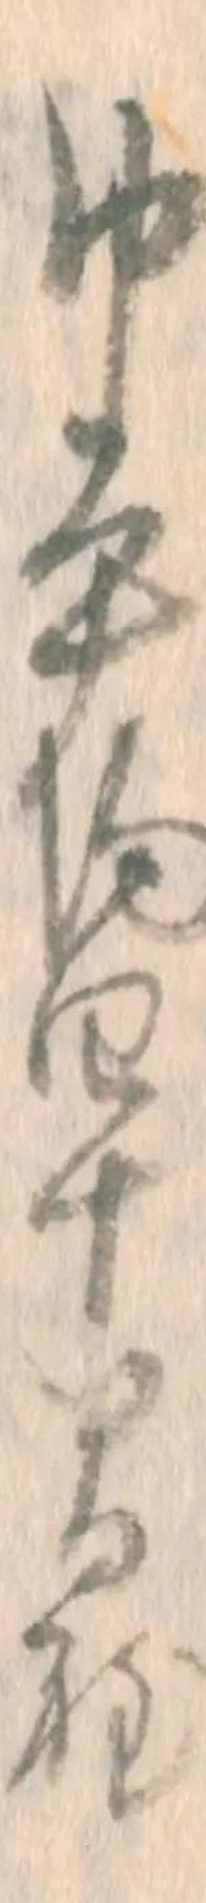幅平均四十間程
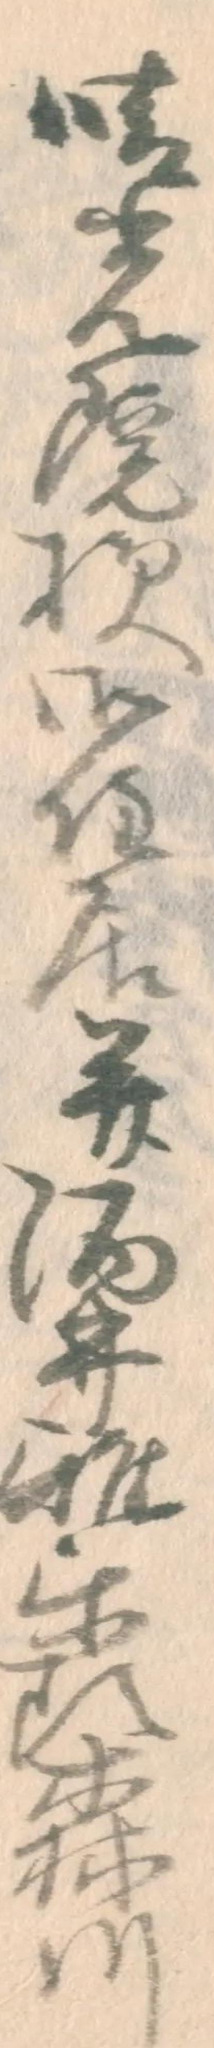一晴光院様御住居幷酒井雅楽頭森川
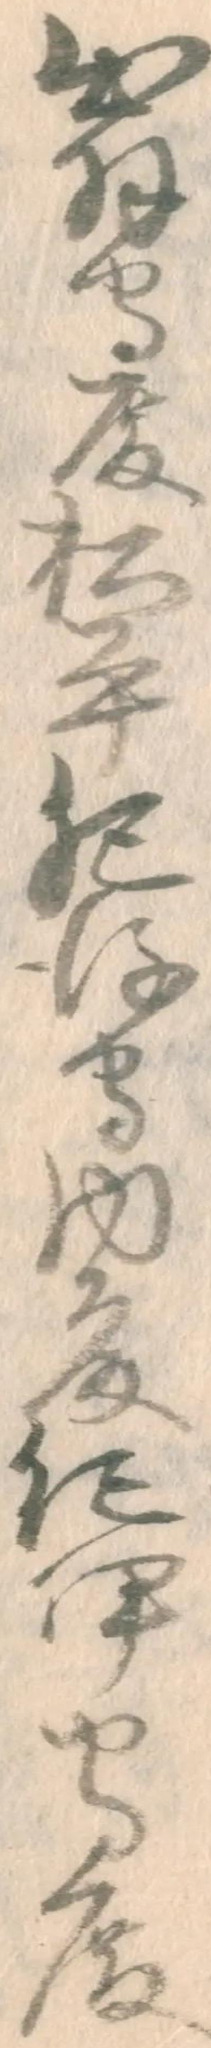出羽守殿松平紀伊守内藤紀伊守殿
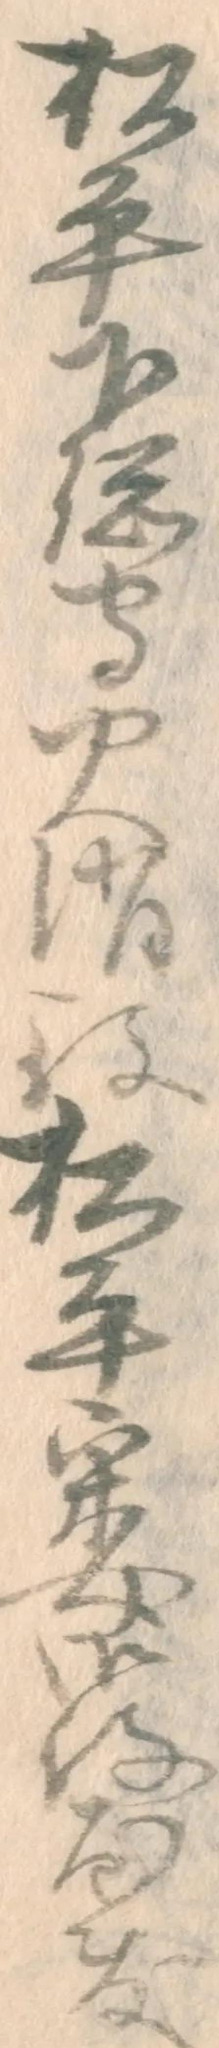松平下総守火消致松平采女御役屋敷
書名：地震災書留 2巻. [1] 内表紙に「地震災書留　安政二卯年　但本所深川御用屋敷地代免除調」とあり
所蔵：国立国会図書館 National Diet Library, JAPAN
